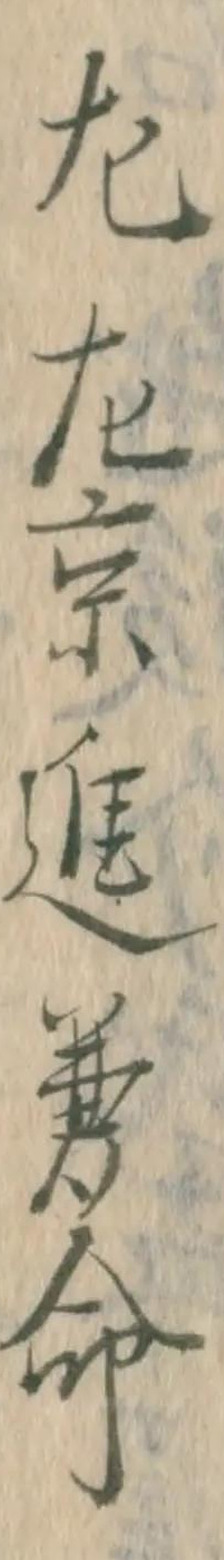左左京進兼命
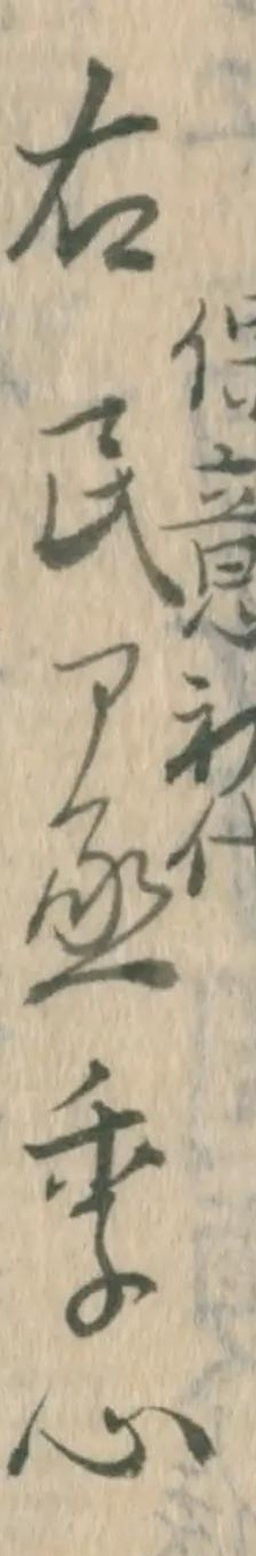右民部丞季心
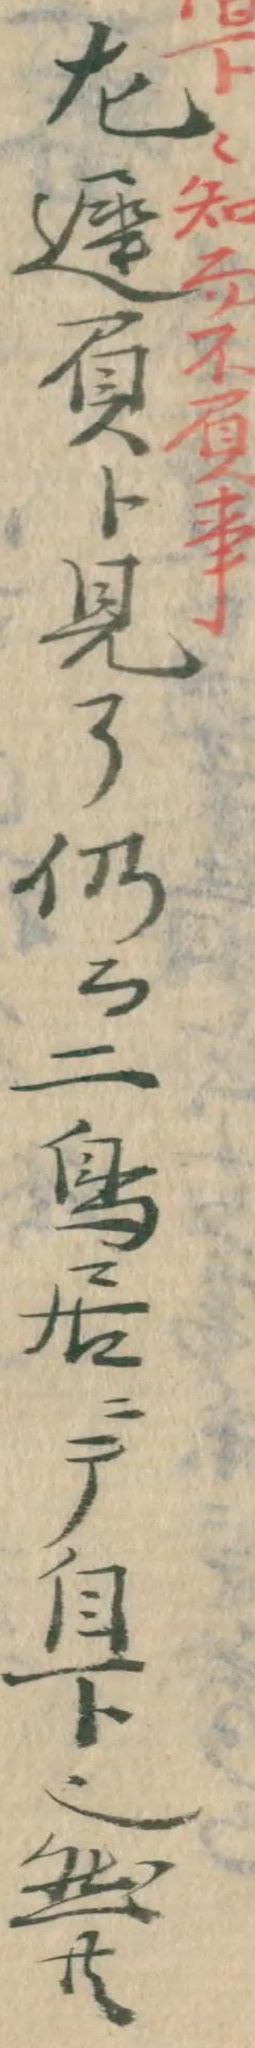左遅負ト見了仍而二鳥居ニテ自下也然共
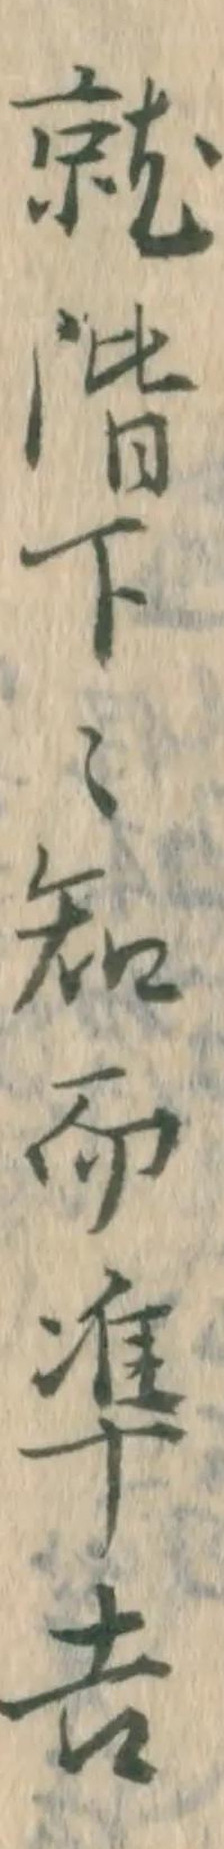就階下々知而準吉
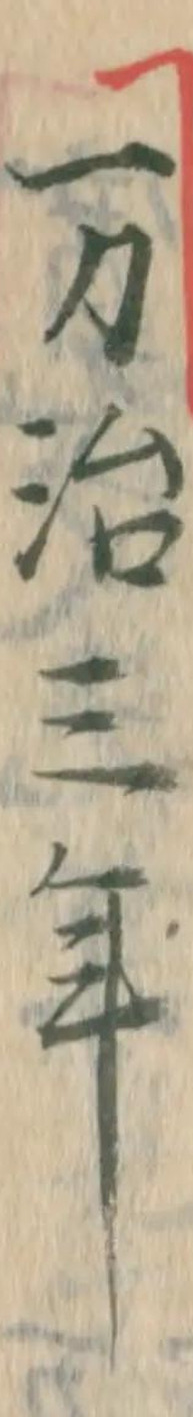万治三年

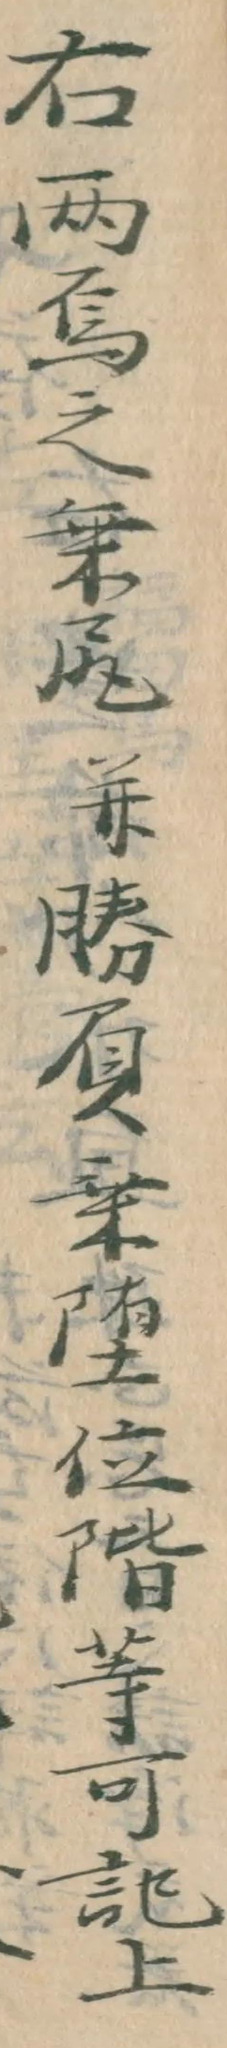右両焉之乗尻并勝負乗堕位階等可記上
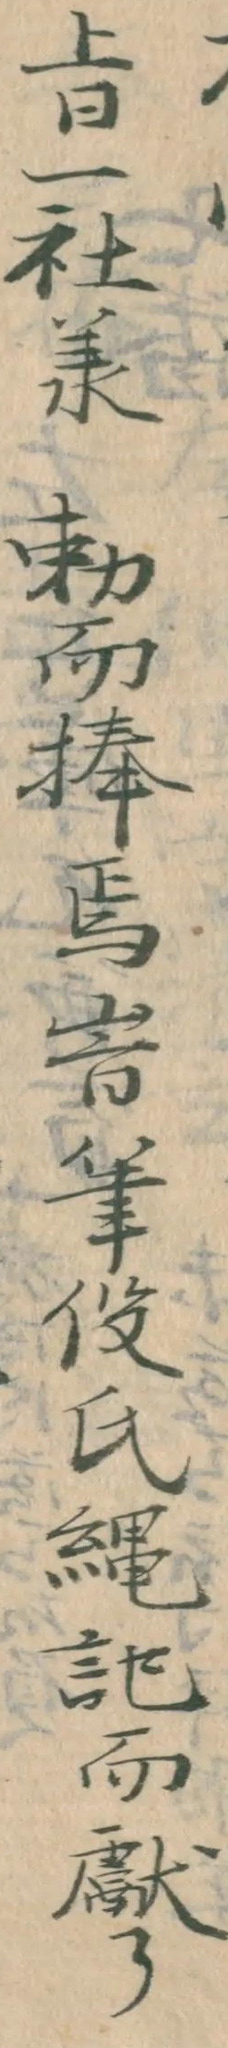旨一社承勅而捧焉旹筆役氏縄記而献了
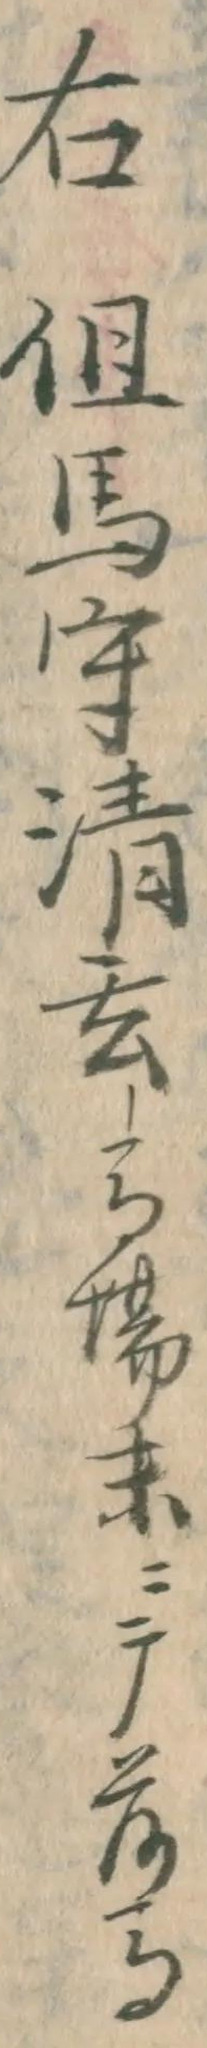右但馬守清玄-馬場末ニテ落馬
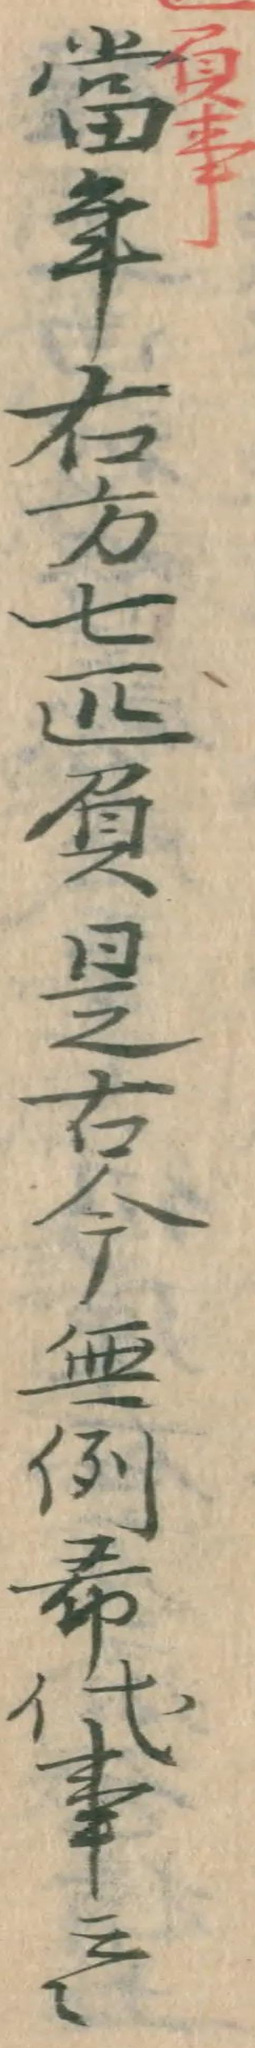当年右方七匹負是古今無例希代事云々
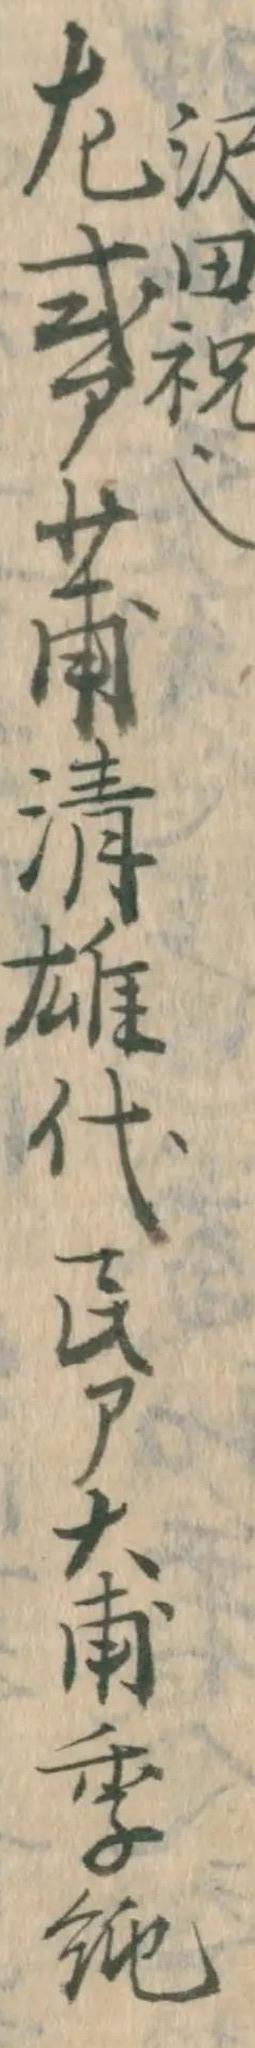左式部少輔清雄代民部大輔季純
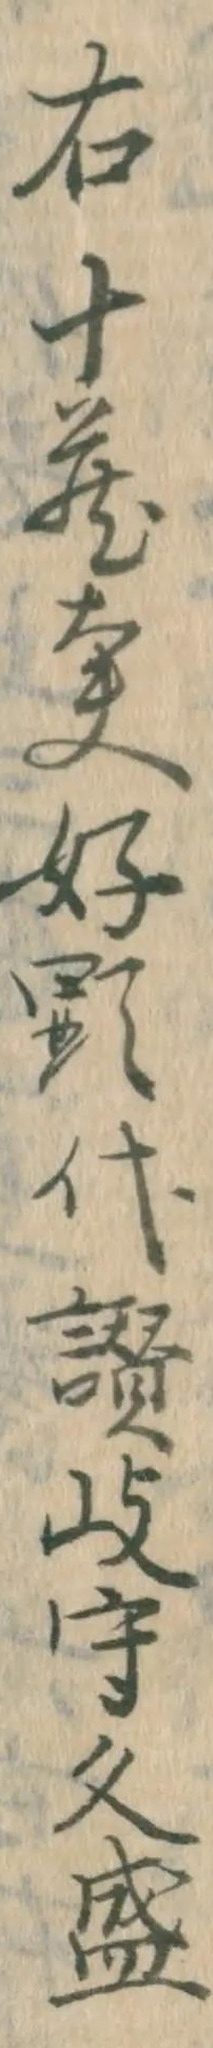右十蔵大夫好顕代讃岐守久盛
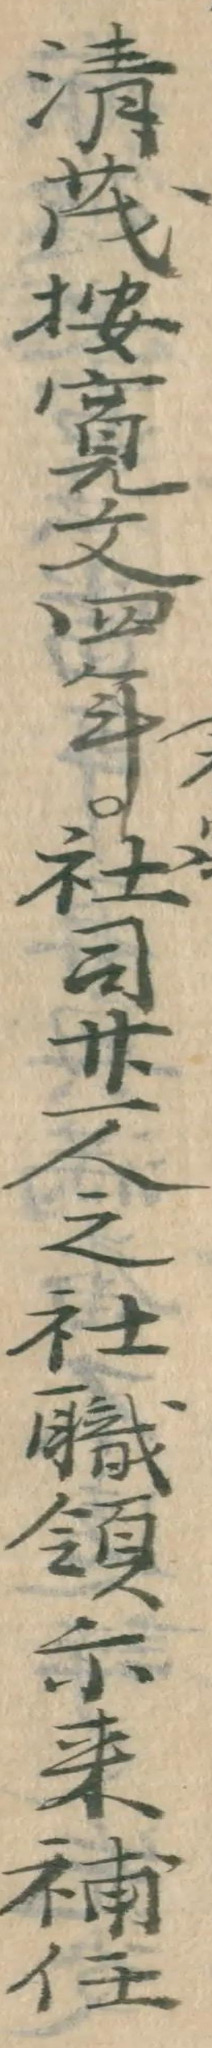清茂按寛文四年￮社司廿一人之社職領爾来補任
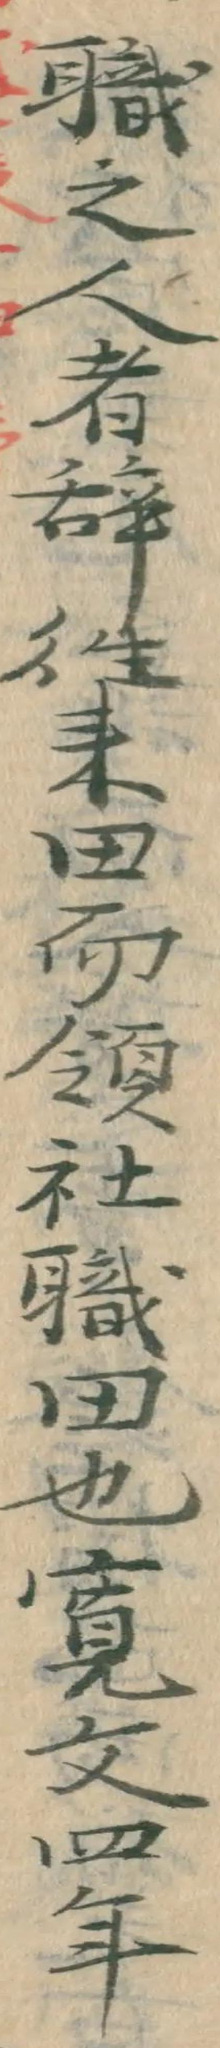職之人者辞往来田而領社職田也寛文四年
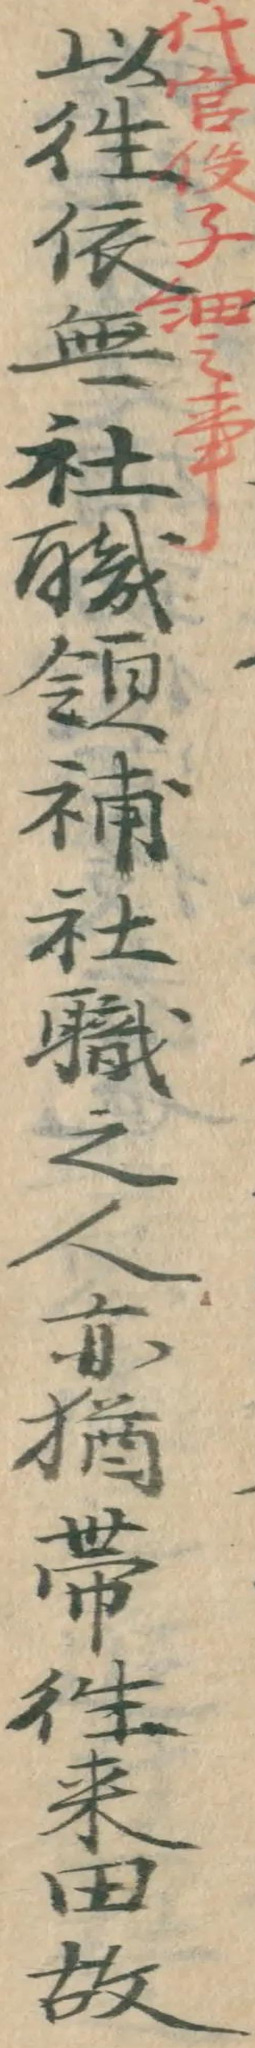以往依無社職領補社職之人亦猶帯往来田故

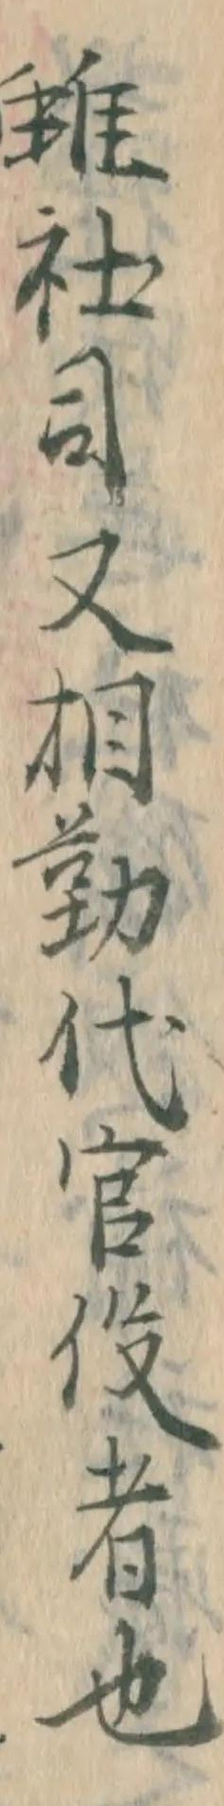雖社司又相勤代官役者也
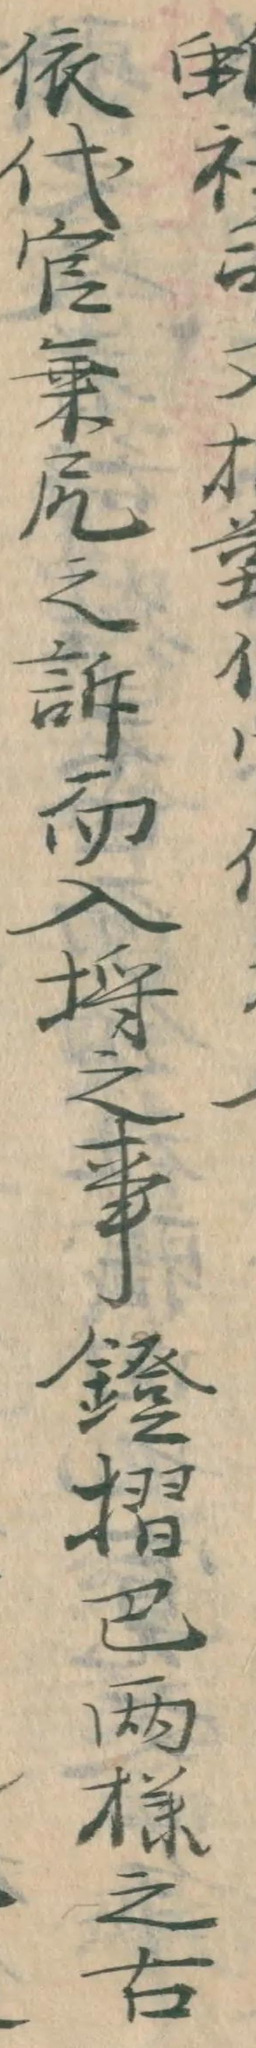依代官乗尻之訴而入埒之事鐙摺巴両様之古
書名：賀茂社記録. 第10冊
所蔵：国立国会図書館 National Diet Library, JAPAN
